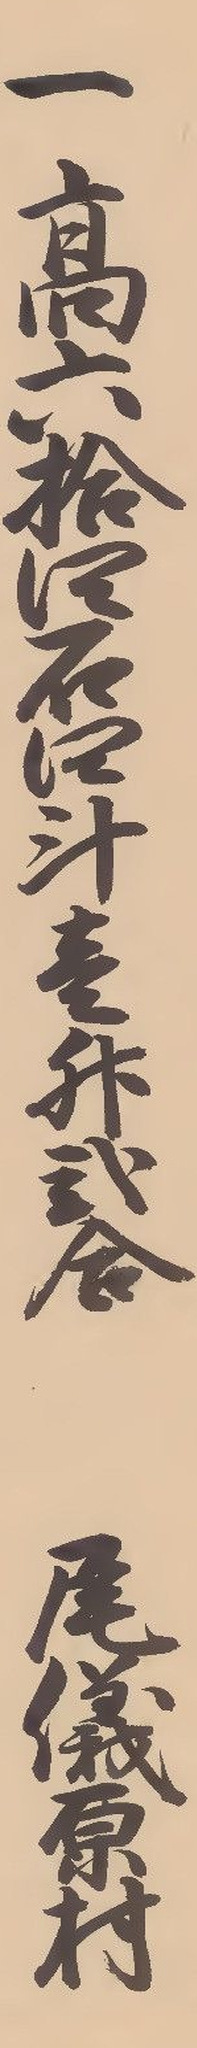一高六拾四石四斗壱升弐合尾儀原村
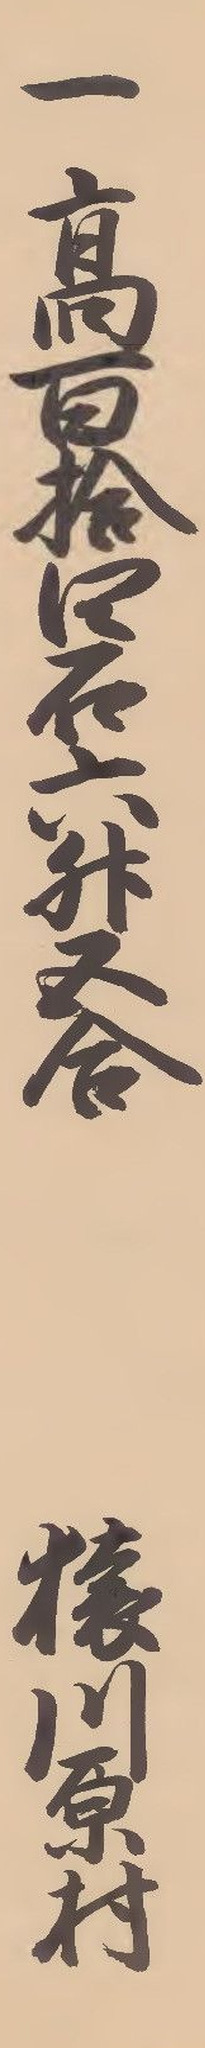一高百拾四石六升五合猿川原村
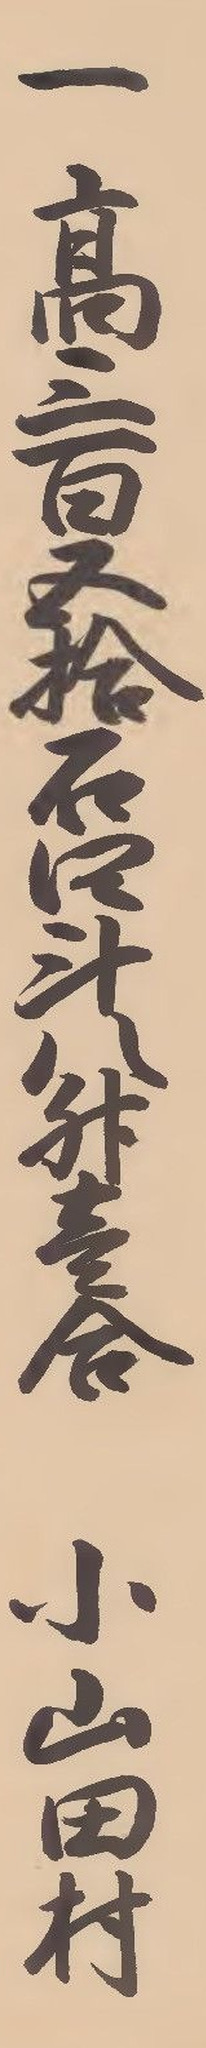一高三百五拾石四斗八升壱合小山田村
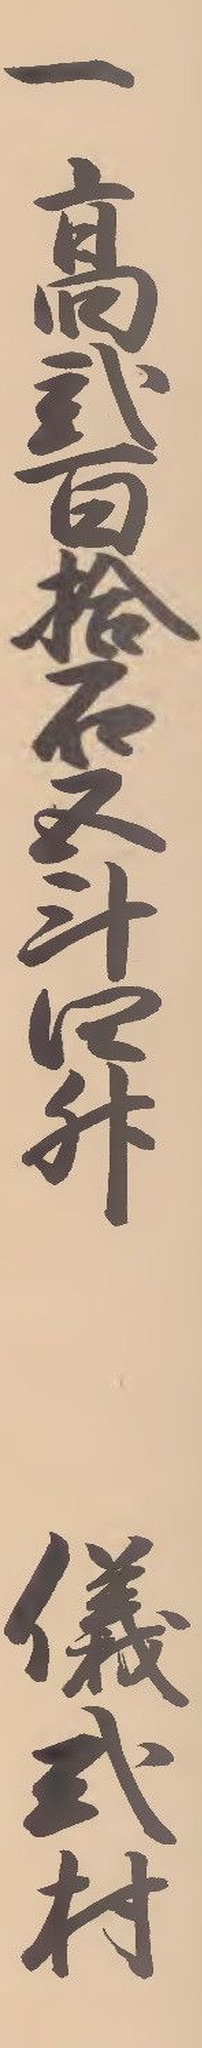一高弐百拾石五斗四升儀式村
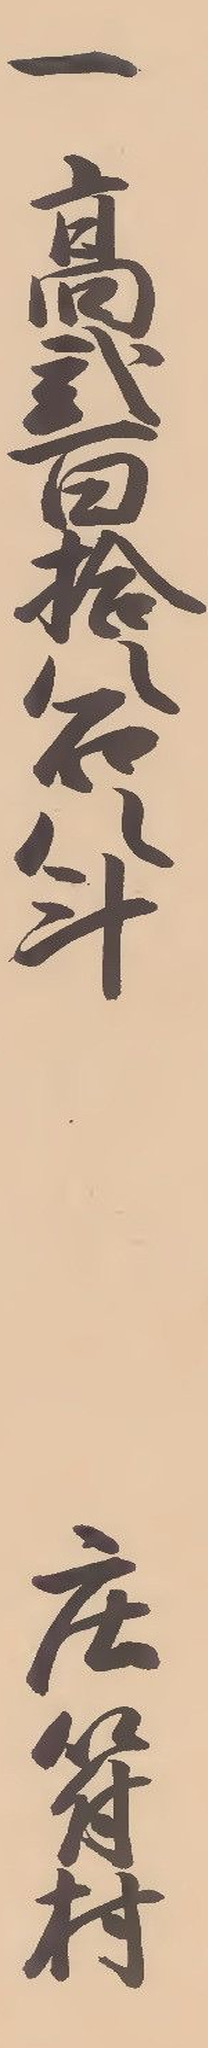一高弐百拾八石八斗庄符村
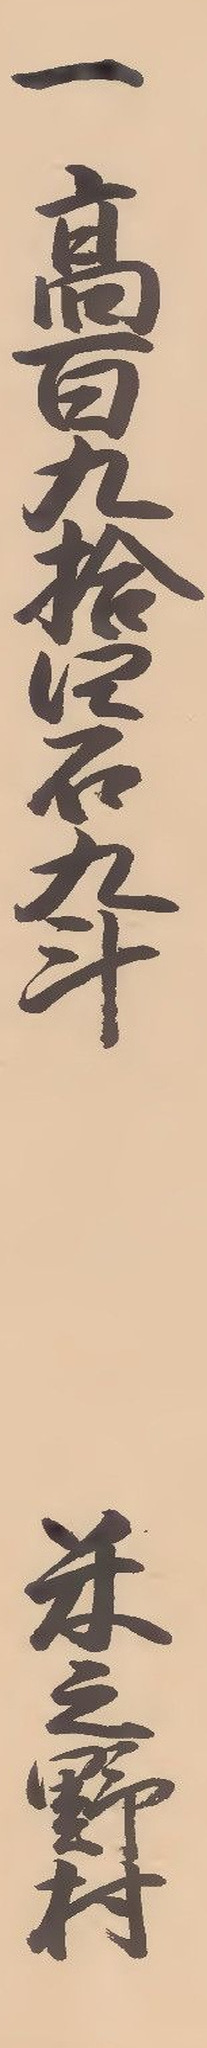一高百九拾四石九斗米之野村
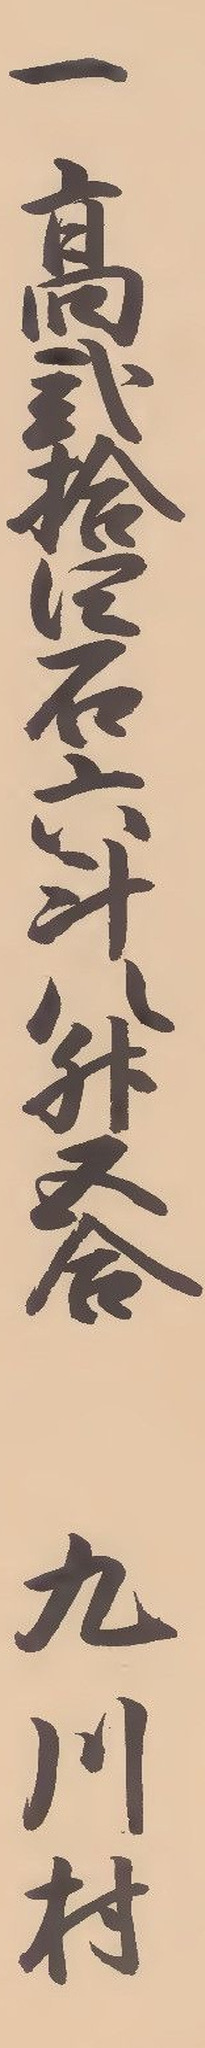一高弐拾四石六斗八升五合九川村

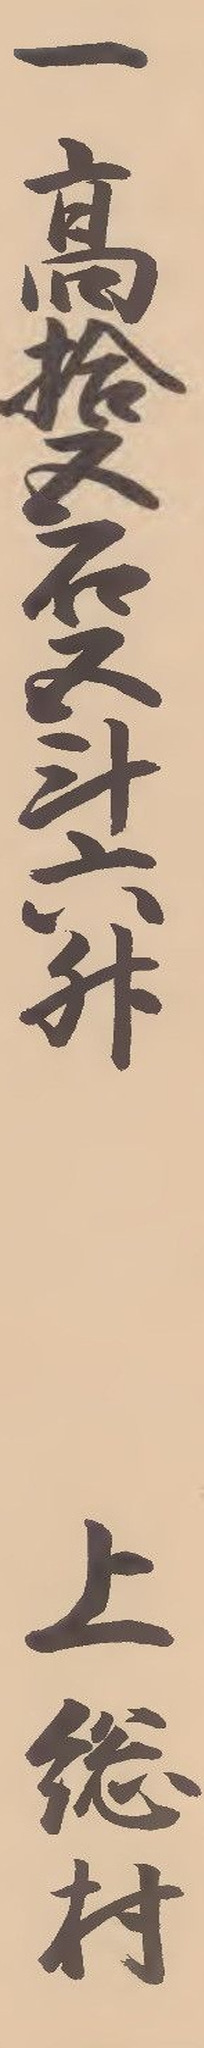一高拾五石五斗六升上総村
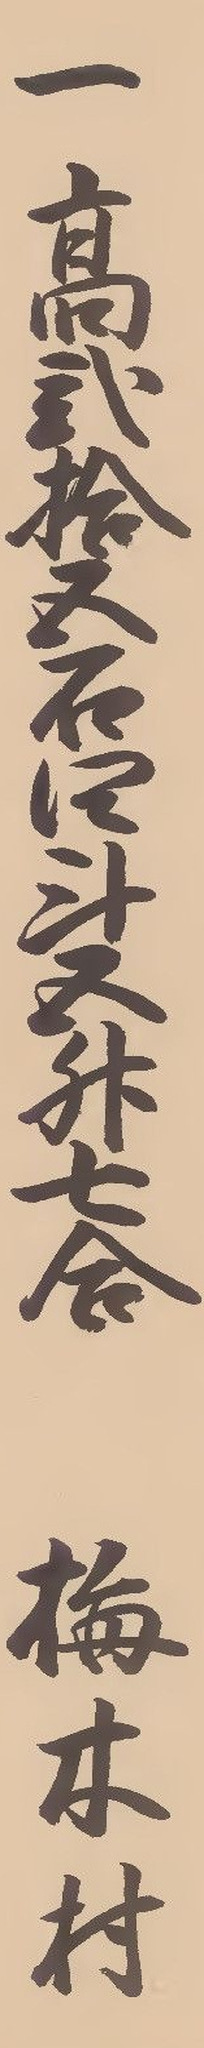一高弐拾五石四斗五升七合梅木村
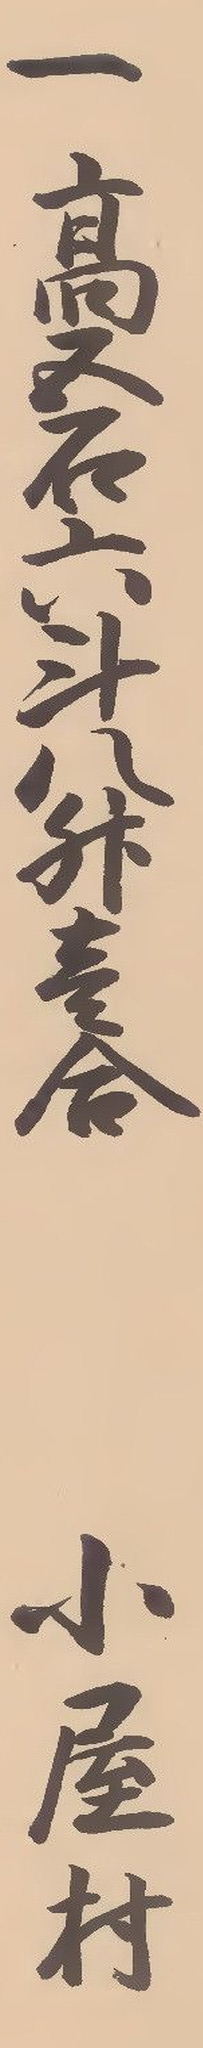一高五石六斗八升壱合小屋村
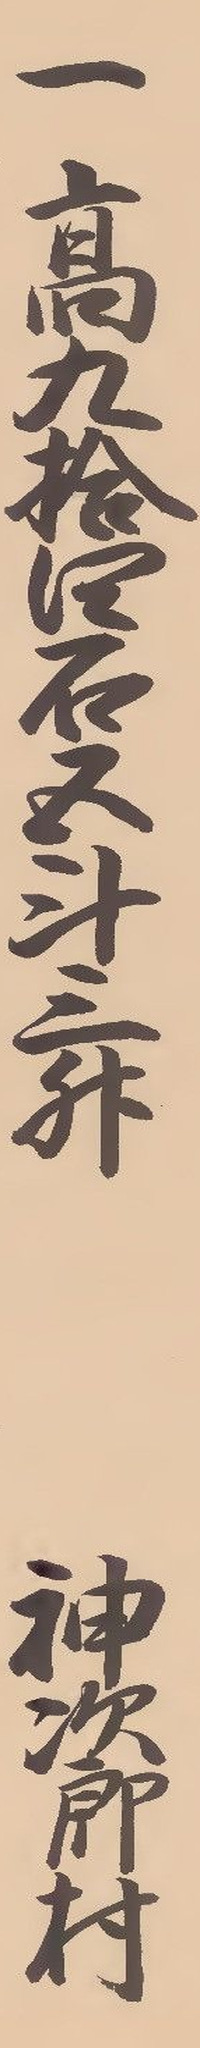一高九拾四石五斗三升神次郎村
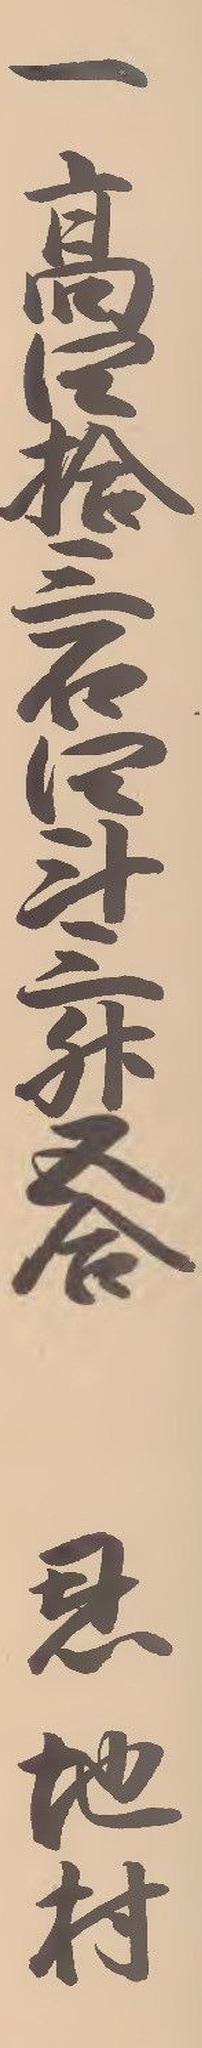一高四拾三石四斗三升五合恩地村
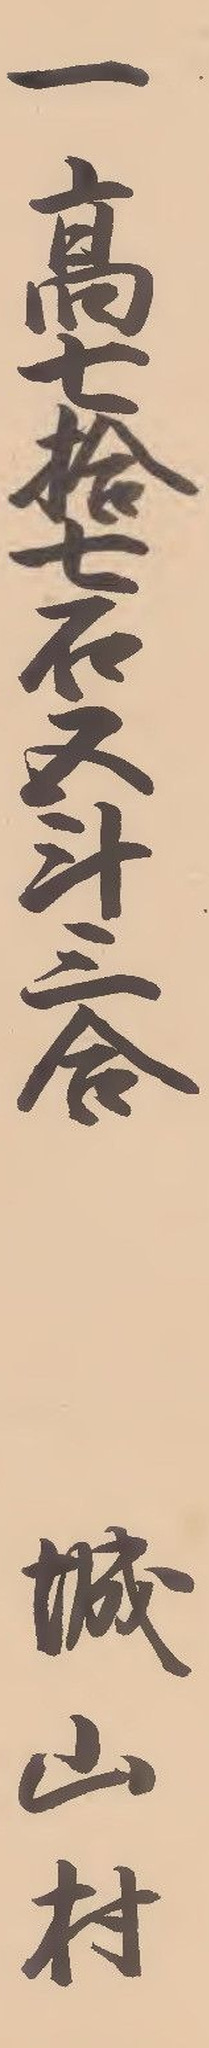一高七拾七石五斗三合城山村
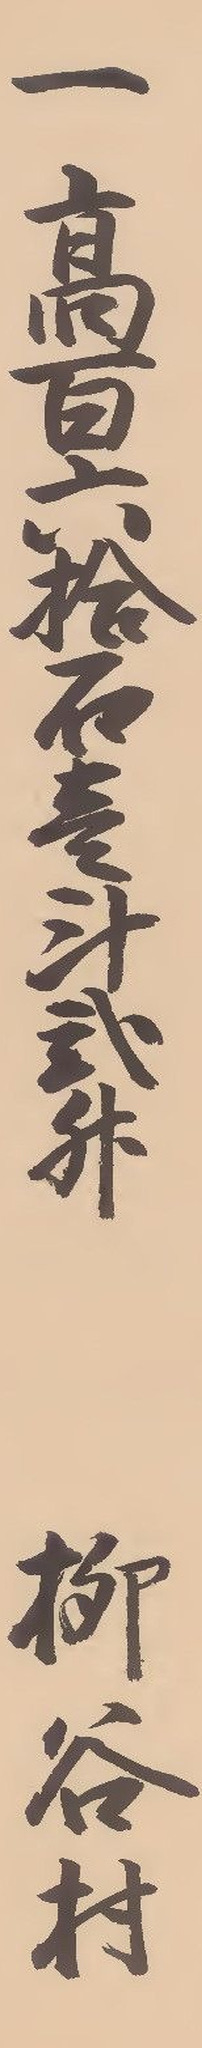一高百六拾石壱斗弐升柳谷村
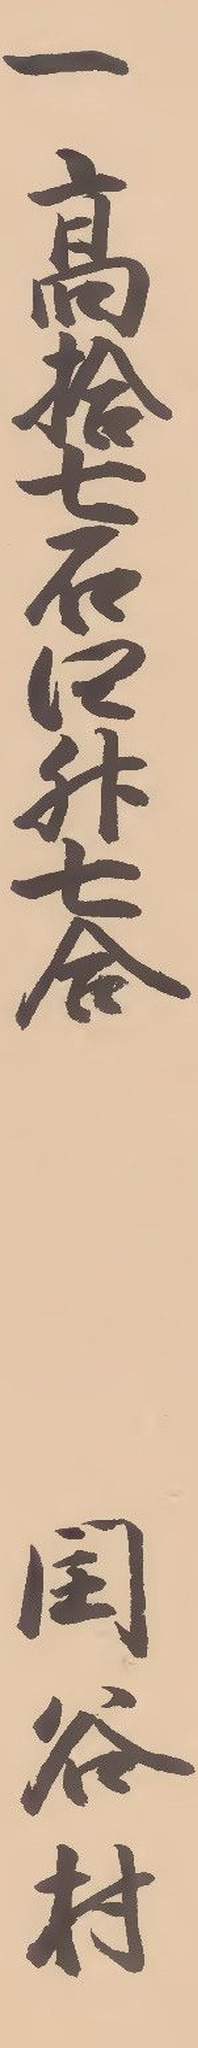一高拾七石四升七合閏谷村

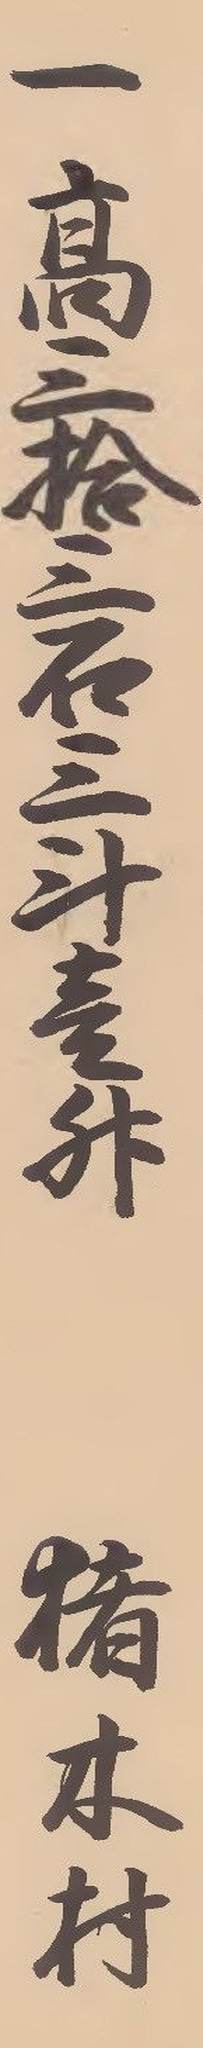一高三拾三石三斗壱升猪木村
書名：伊予国郷帳
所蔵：国立公文書館 National Archives of Japan
